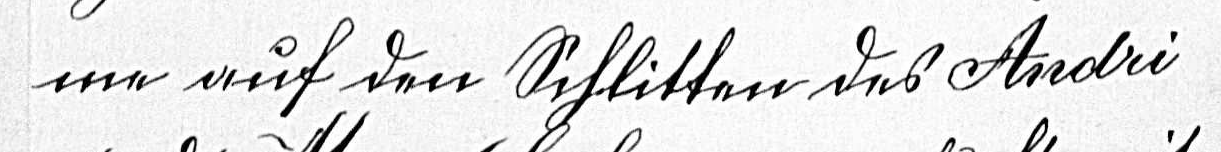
me auf den Schlitten des Andri
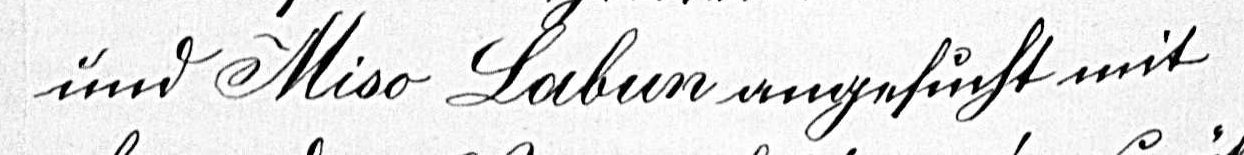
und Miso Labun angesucht mit
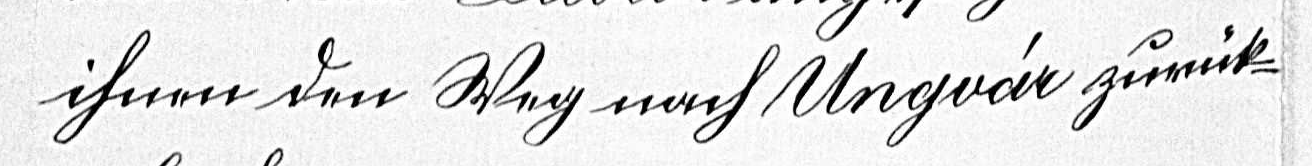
ihnen den Weg nach Ungvár zurück¬
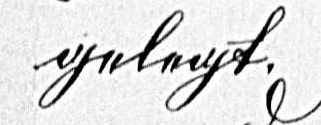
gelegt.
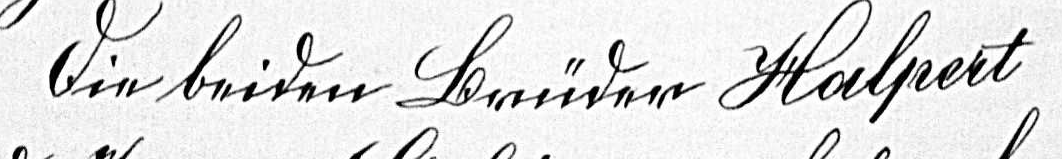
Die beide Brüder Halpert
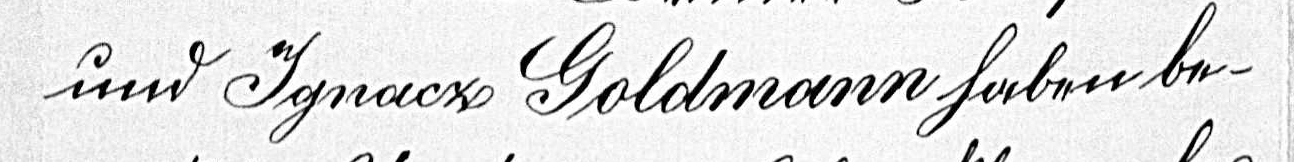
und Jgnacz Goldmann haben be¬
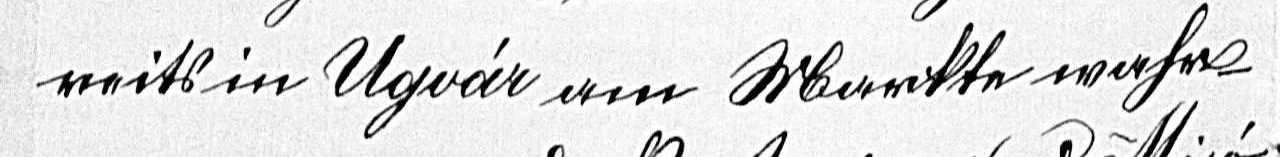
reits in Ugvár am Markte wahr¬
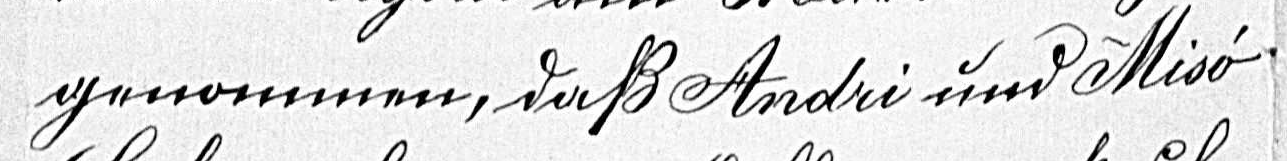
genommen, daß Andri und Misó
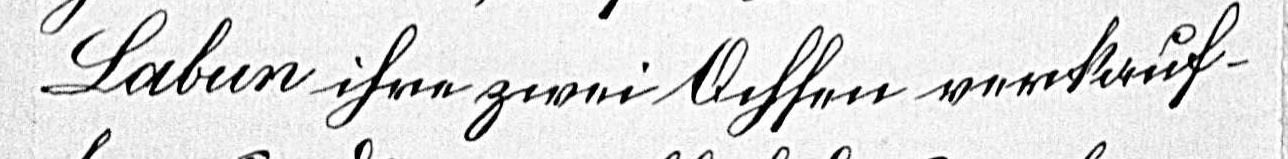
Labun ihre zwei Ochsen verkauf¬
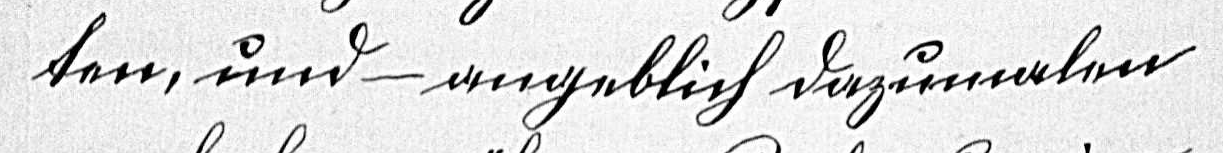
ten, und - angeblich dazumalen
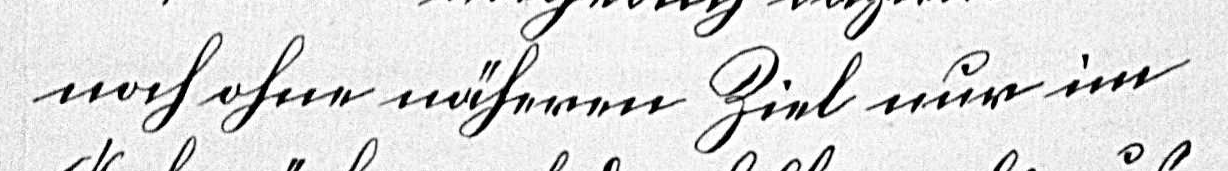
noch ohne näheren Ziel nur im
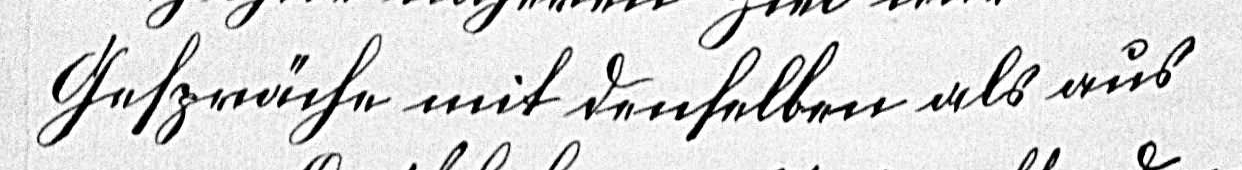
Gespräche mit denselben als aus
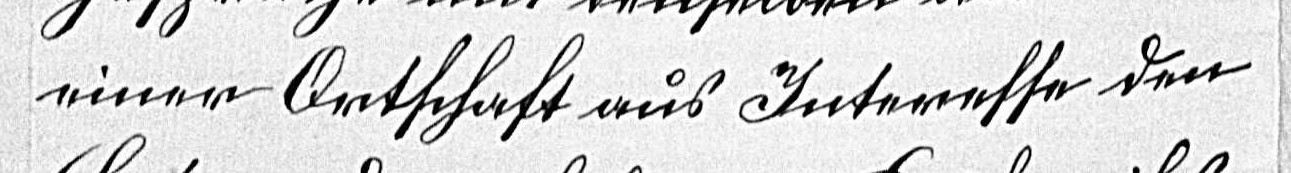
einer Ortschaft aus Interesse den
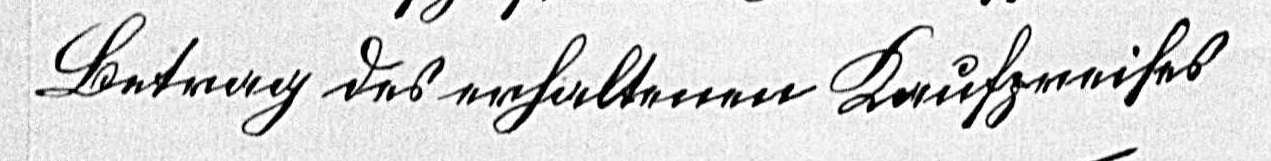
Betrag des erhaltenen Kaufpreises
